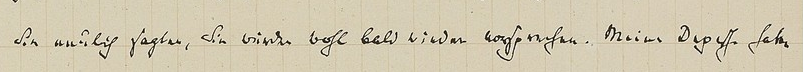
Sie neulich sagten, Sie würden wohl bald wieder vorsprechen. Meine Depesche hatte
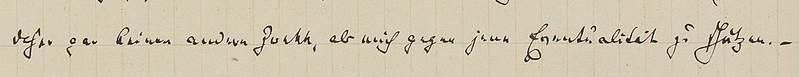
daher gar keinen anderen Zwekk, als mich gegen jene Eventualität zu schützen. –
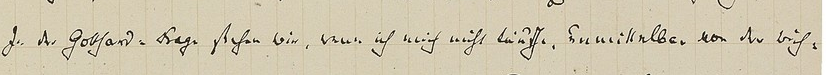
In der Gotthard-Frage stehen wir, wenn ich mich nicht täusche, unmittelbar vor der wich-
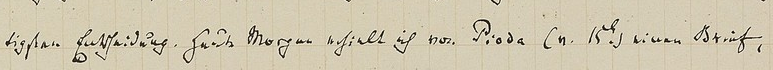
tigsten Entscheidung. Heute Morgen erhielt ich von Pioda (v. 15t.) einen Brief,
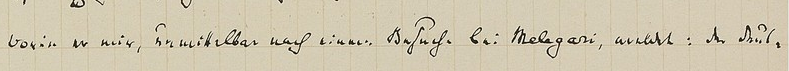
worin er mir, unmittelbar nach einem Besuche bei Melegari, meldet: der deut-
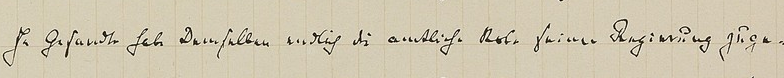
sche Gesandte habe Demselben endlich die amtliche Note seiner Regierung zuge-
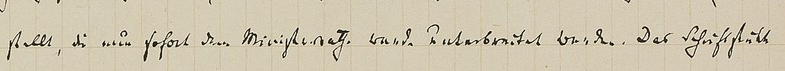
stellt, die nun sofort dem Ministerrathe werde unterbreitet werden. Das Schriftstükk
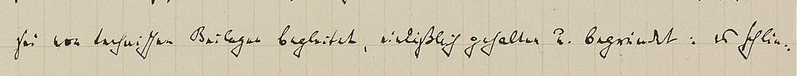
sei von technischen Beilagen begleitet, einläßlich gehalten u. begründet: es schlie-
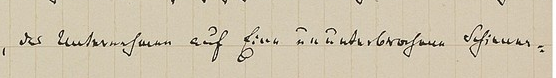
das Unternehmen auf Eine ununtebrochene
